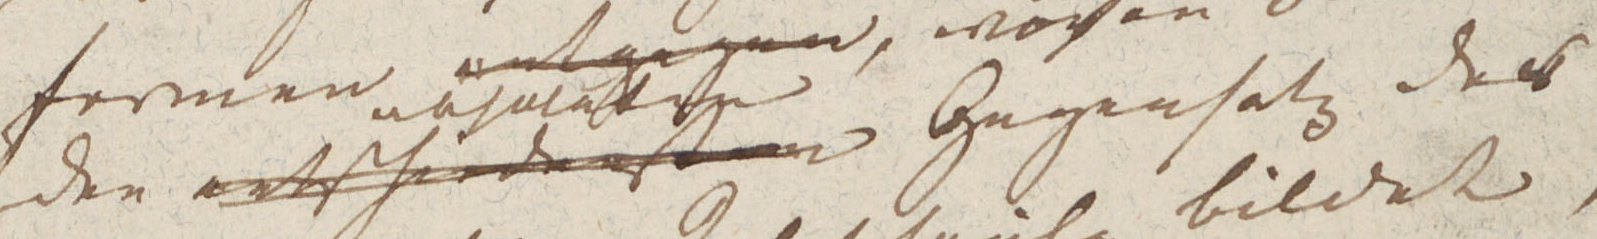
den entschiedensten absoluten Gegensatz desr
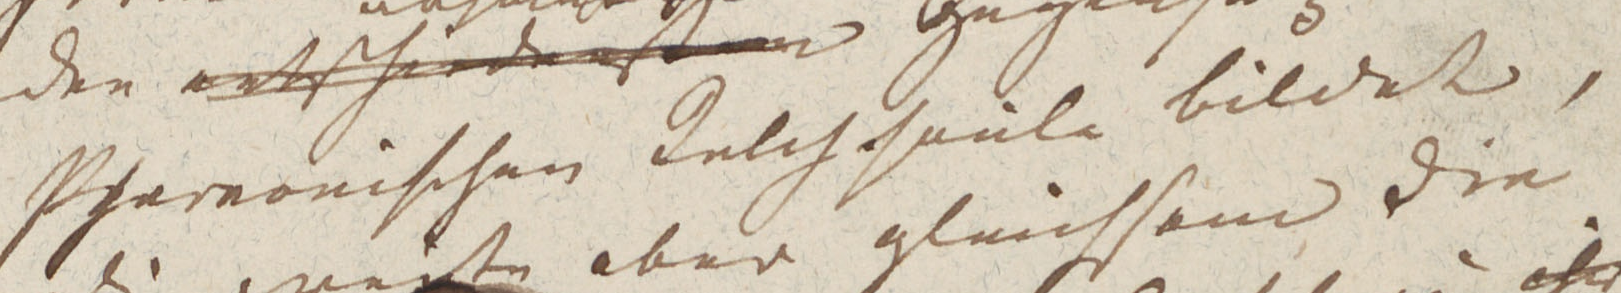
Pharaonischen Kelchsaule bildet,
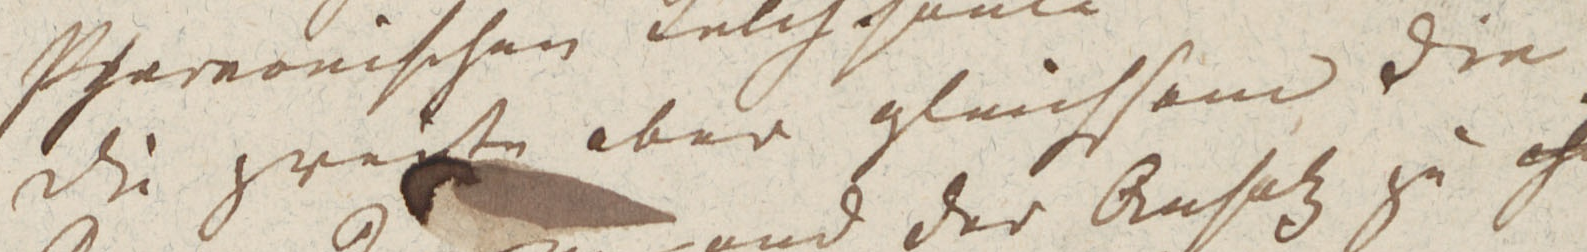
die zweite aber gleichsam die
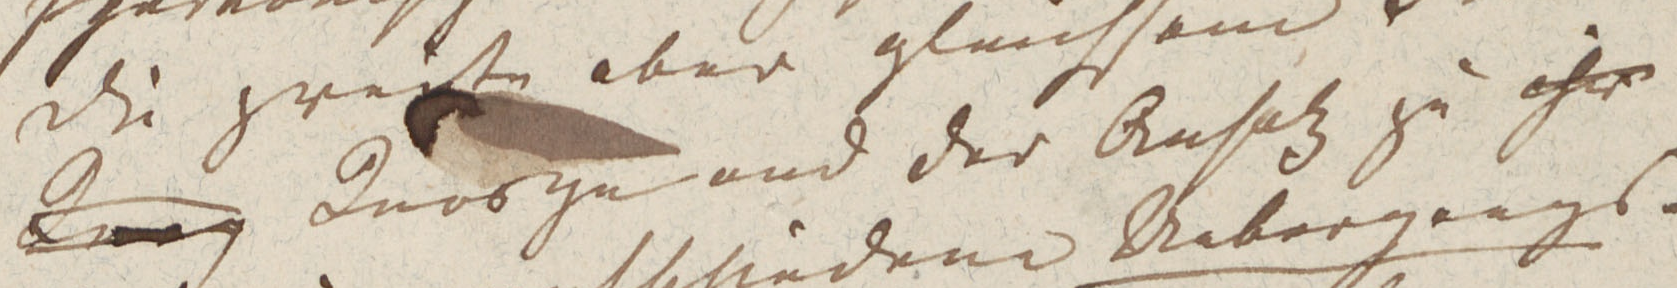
Knos Knospe und der Ansatz zu ihr
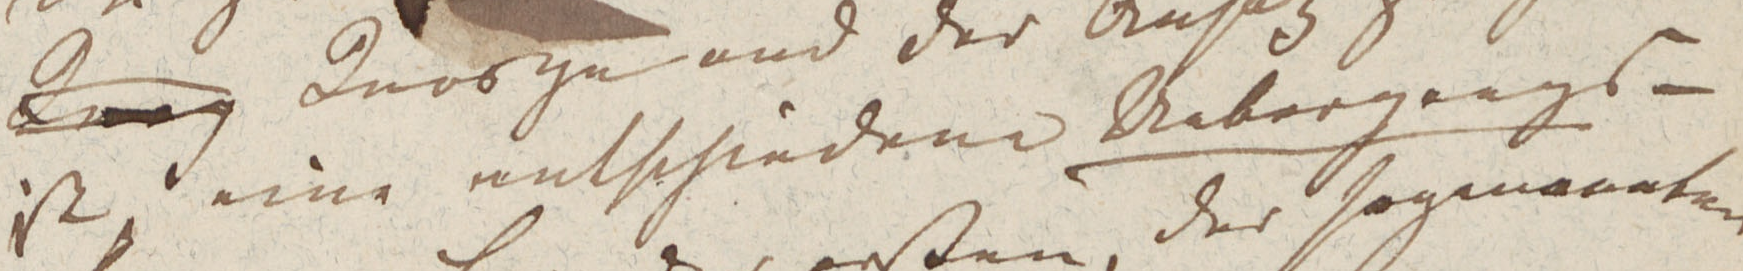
ist eine entschiedene Uebergangs-
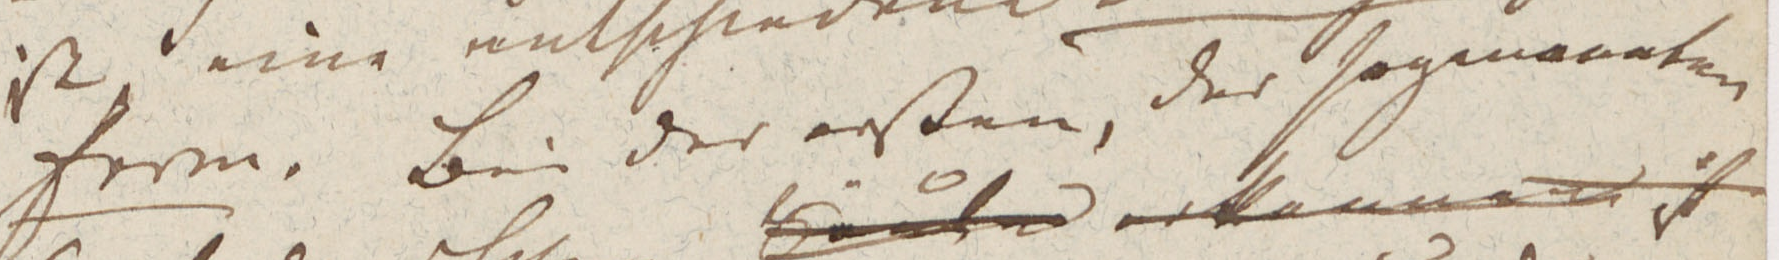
form. Bei der ersten, der sogenannten
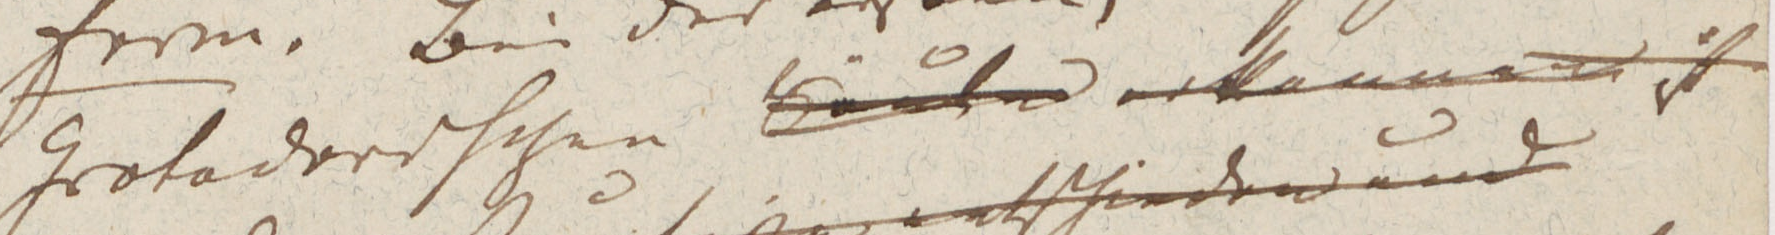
Protodorischen Säule erkennen ist
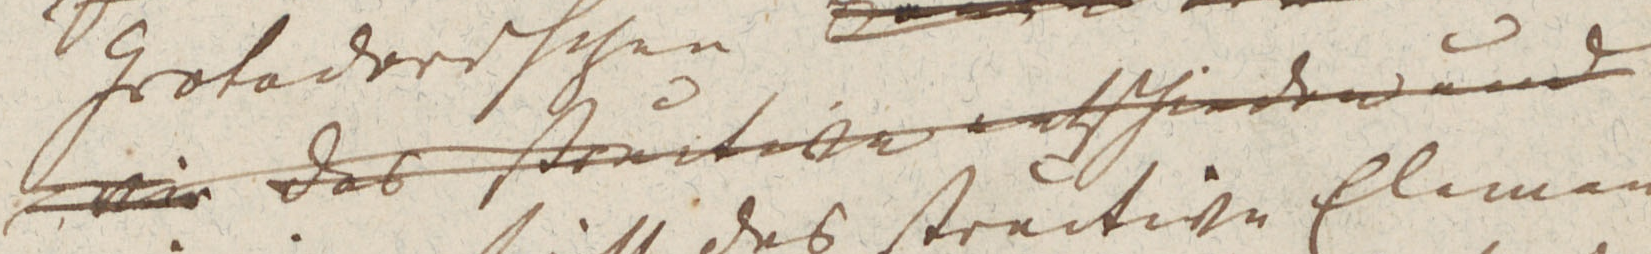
wir das structive entschieden und
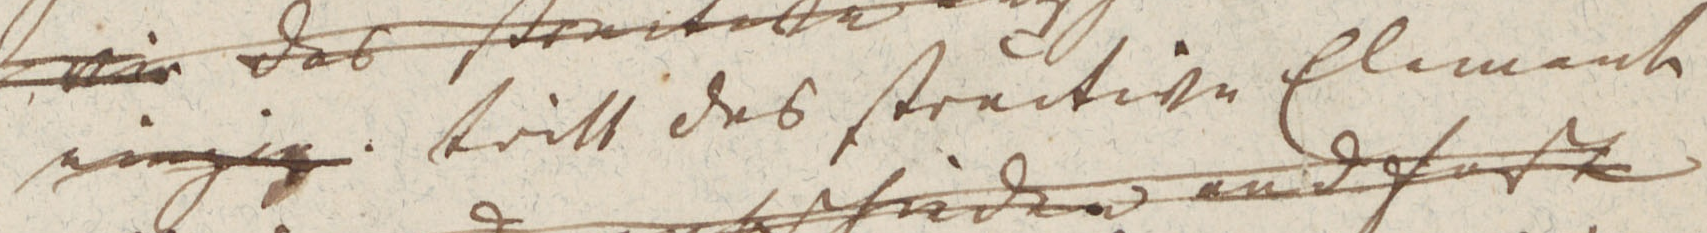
einzig tritt das structive Element
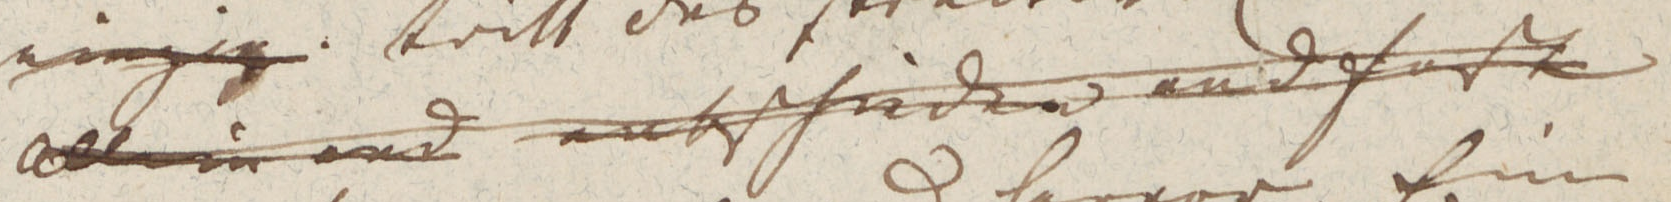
allein und entschieden und fort
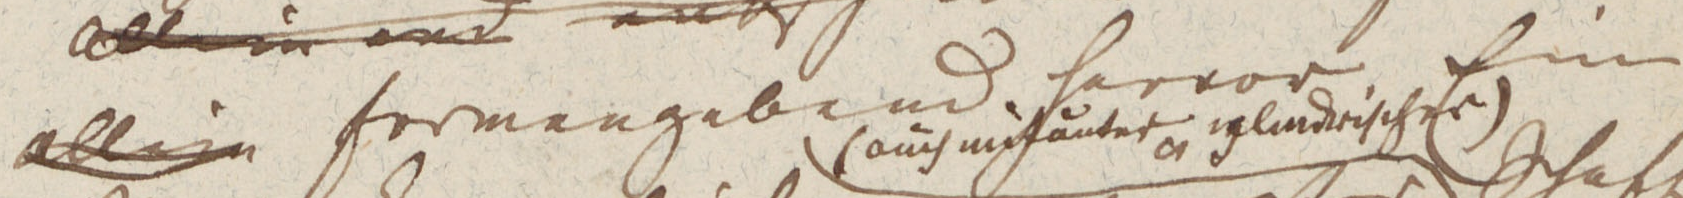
allein formengebend hervor. Ein
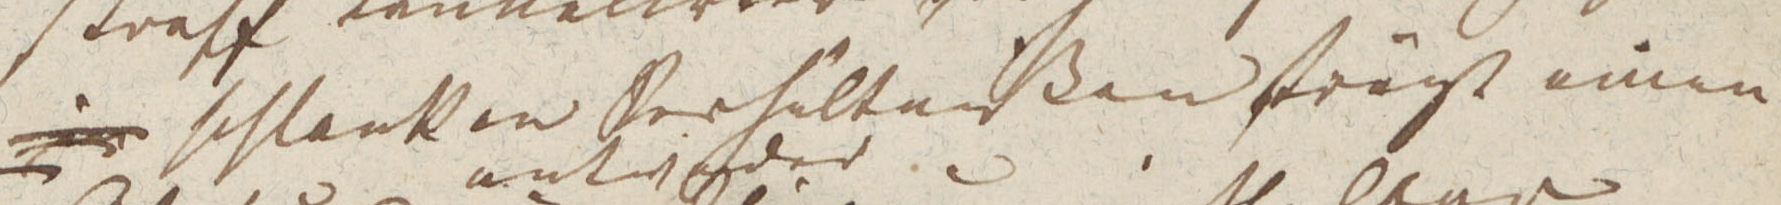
in schlanken Verhältnissen trägt einen
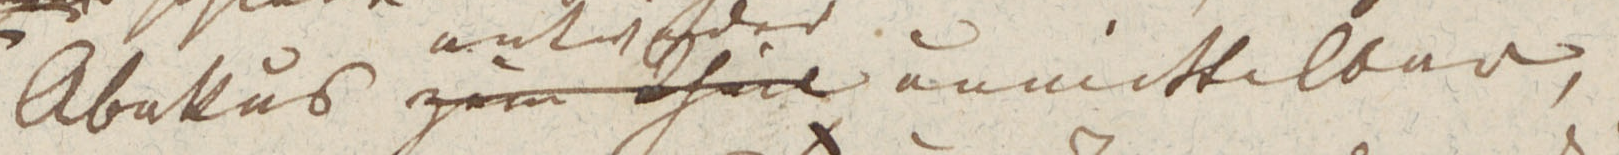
Abakus zum Theil entweder unmittelbar,
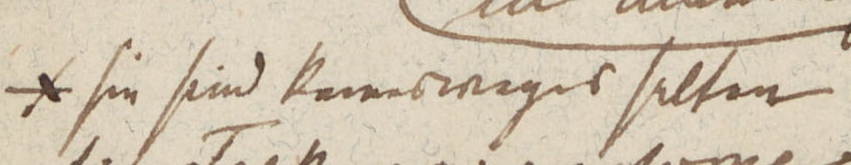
% sie sind keinesweges selten
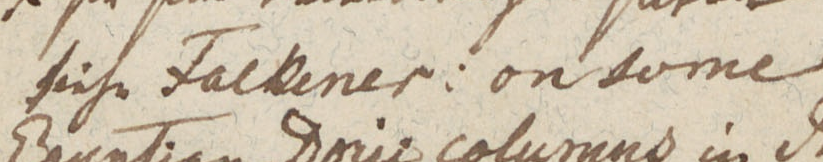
siehe Falkener: on some
